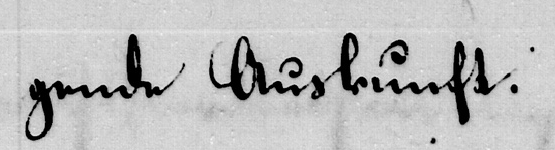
gende Auskunft.
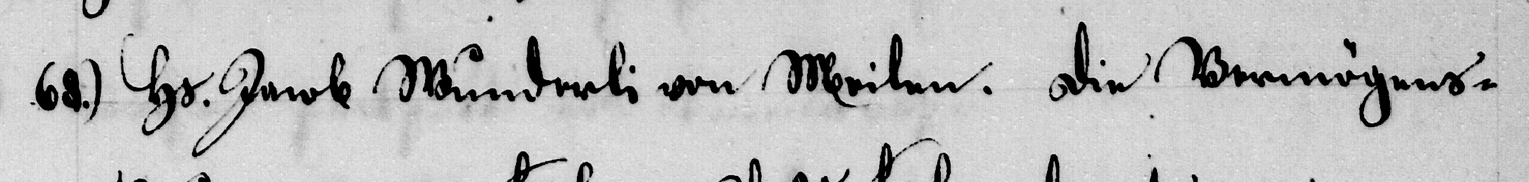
68.) Hs. Jacob Wunderli von Meilen. Die Vermögens¬
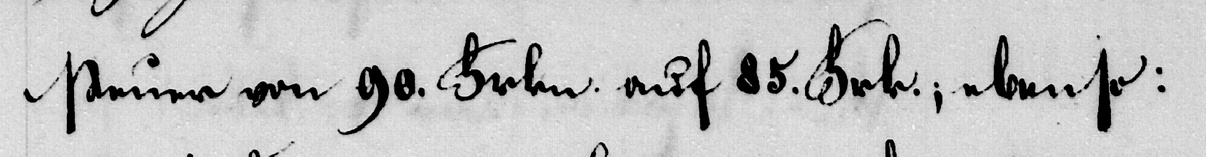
steuer von 90. Frkn. auf 85. Frk.; ebenso:
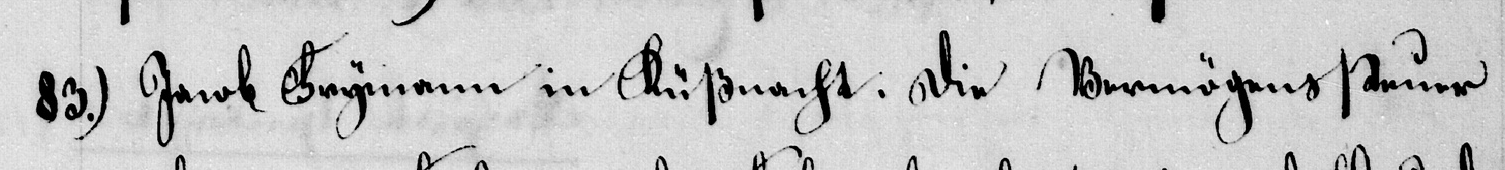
83.) Jacob Frymann in Küßnacht. Die Vermögenssteuer
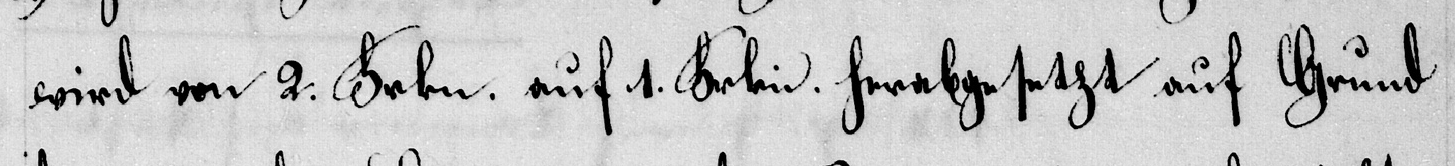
wird von 2. Frkn. auf 1. Frkn. herabgesetzt auf Grund
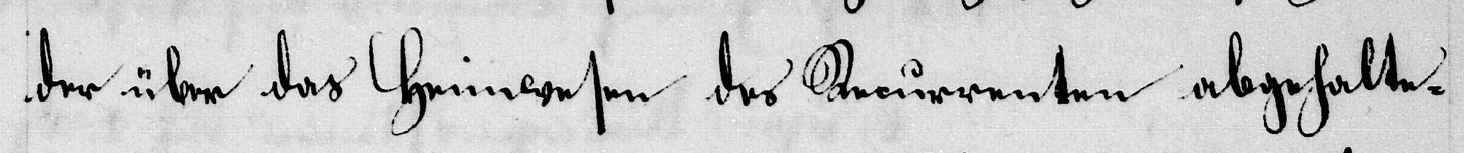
der über das Heimwesen des Recurrenten abgehalte¬
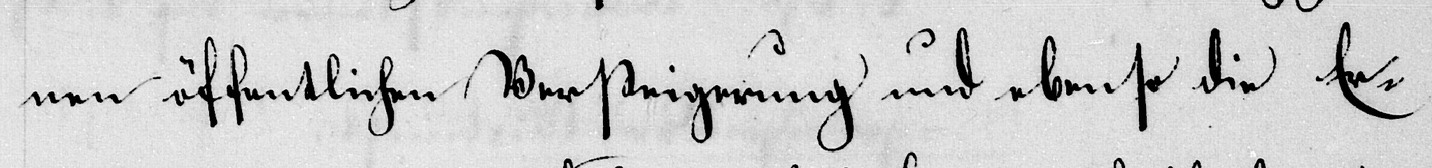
nen öffentlichen Versteigerung und ebenso die Er¬
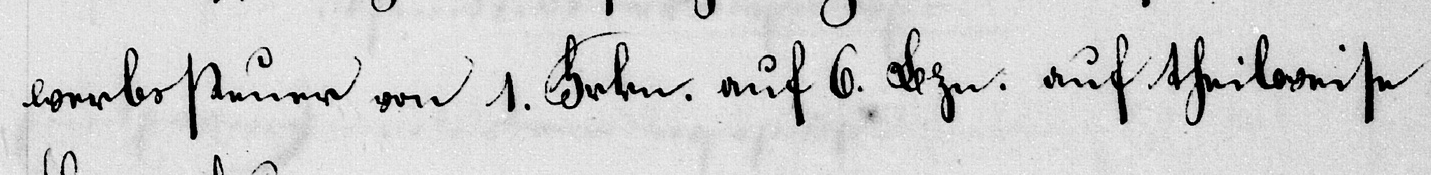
werbssteuer von 1. Frkn. auf 6. Bzn. auf theilweise
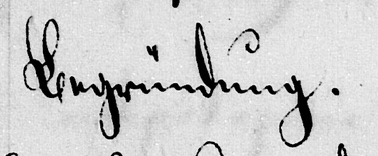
Begründung.
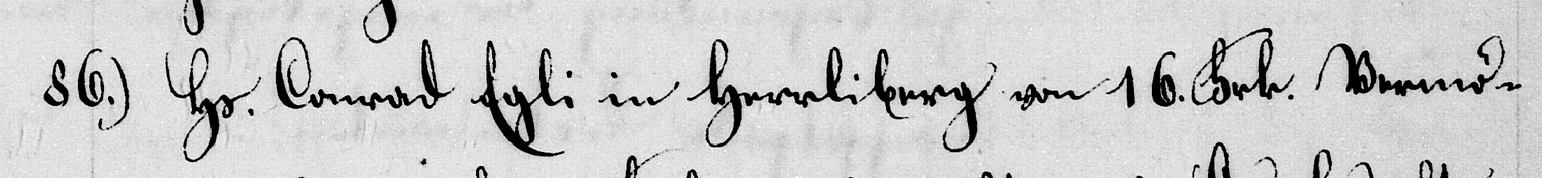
86.) Hs. Conrad Egli in Herrliberg von 16. Frk. Vermö¬
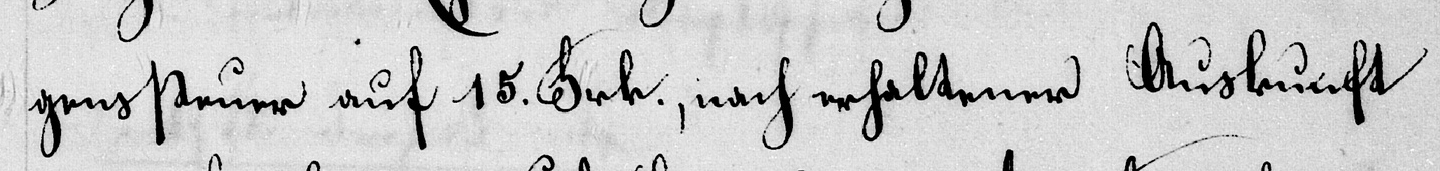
genssteuer auf 15. Frk., nach erhaltener Auskunft
